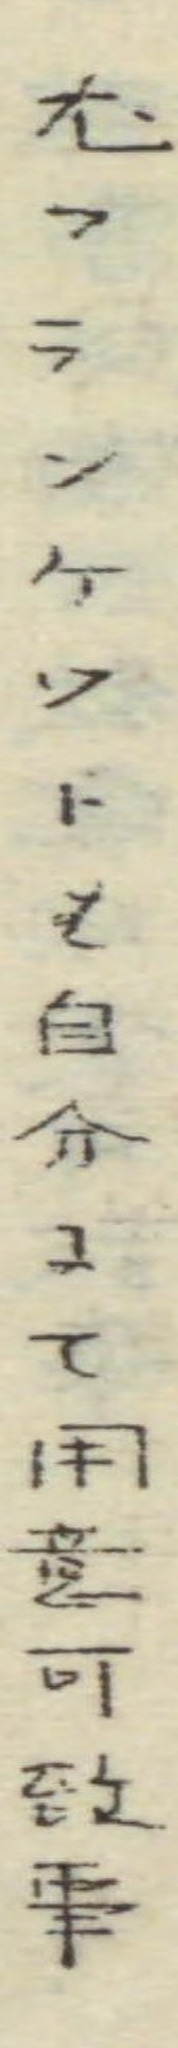尤フランケットは自分にて用意可致事
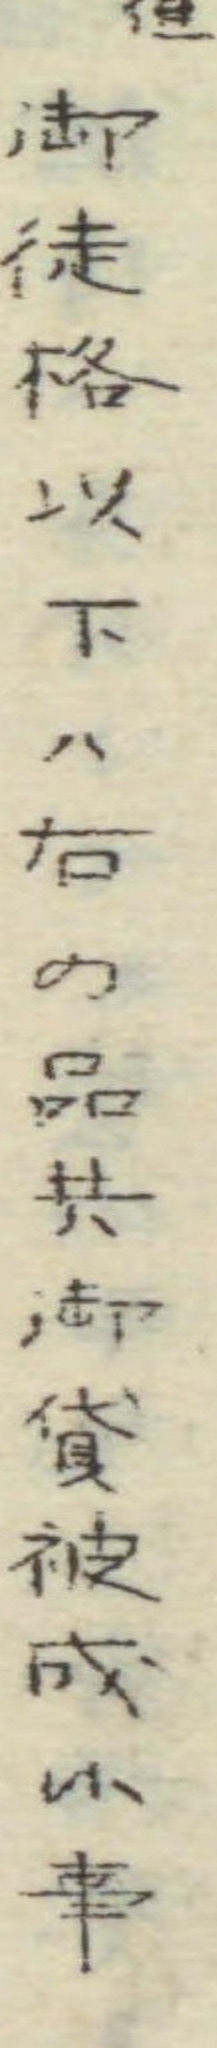但御徒格以下ハ右の品共御貸被成候事
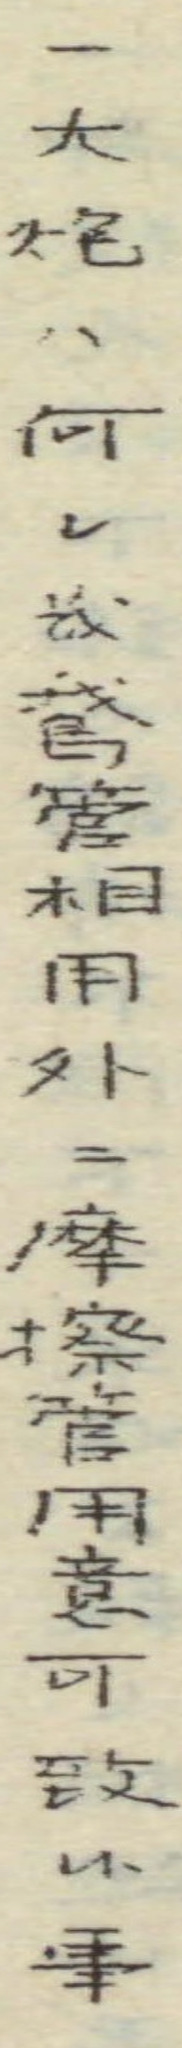一大炮ハ何レも鵞管相用外二摩擦管用意可致候事
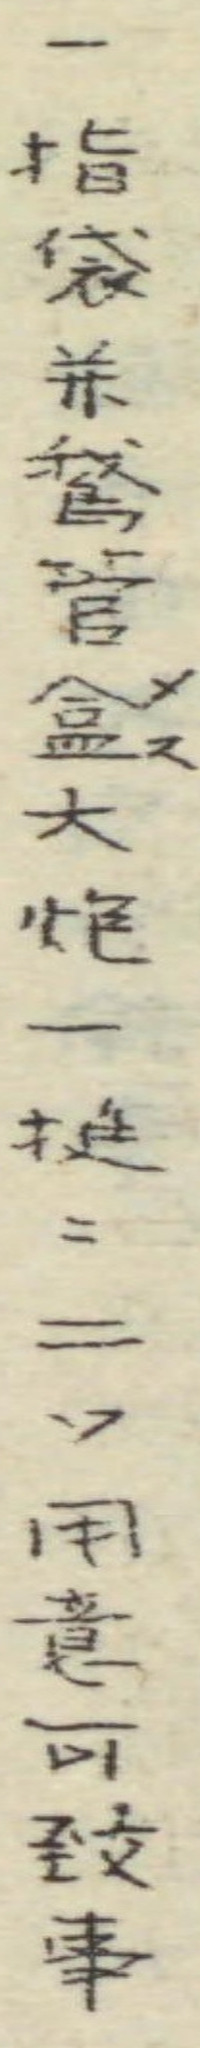一指袋并鵞管聘盒大炮一挺二二ッ用意可致事
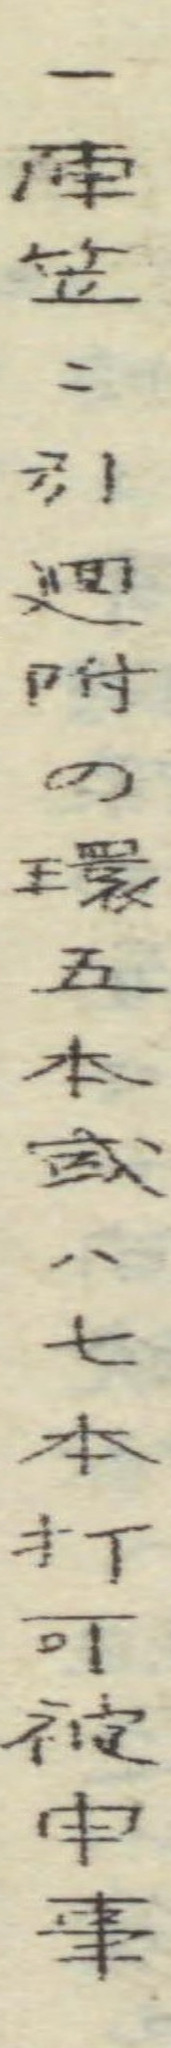一陣笠二引廻附の奸環五本或ハ七本打可被申事
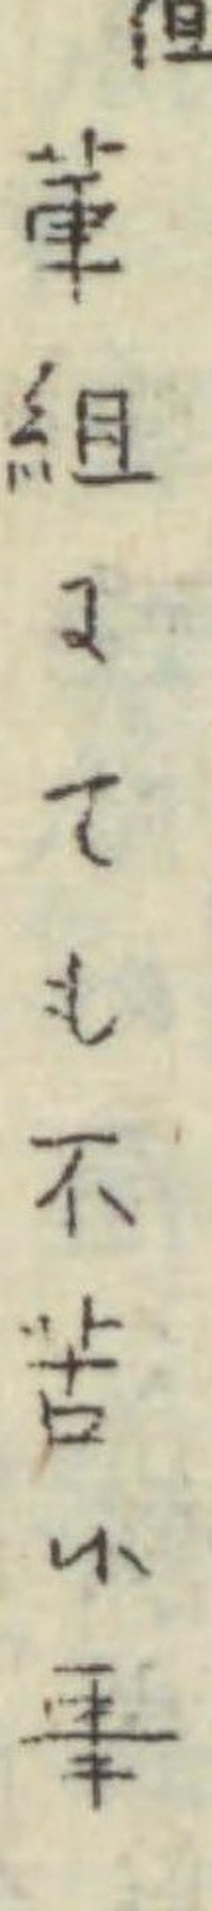但革組にても不苦候事
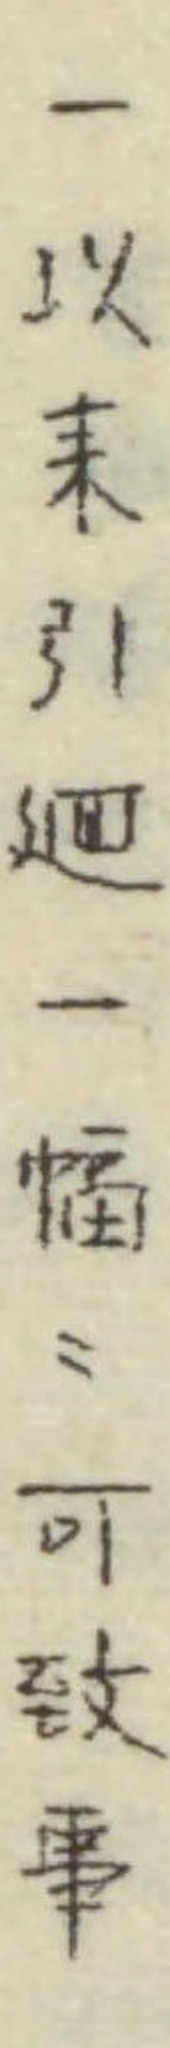一以来引廻一幅二可致事
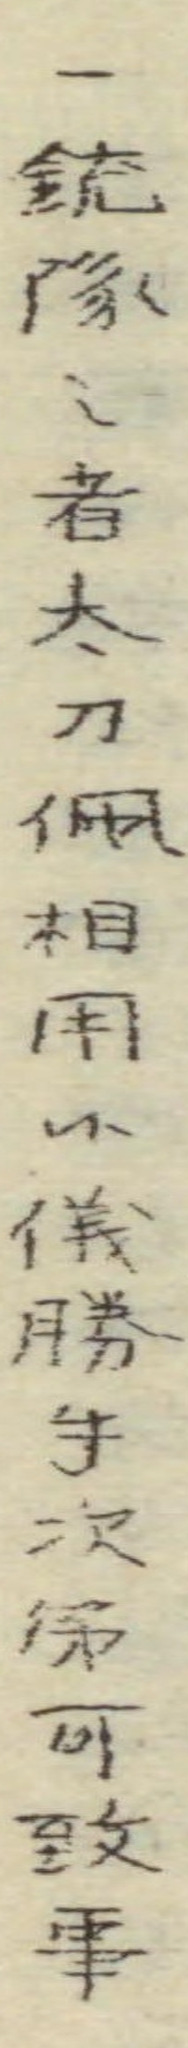一銃隊之者た太刀佩相用候儀勝手次第可致事
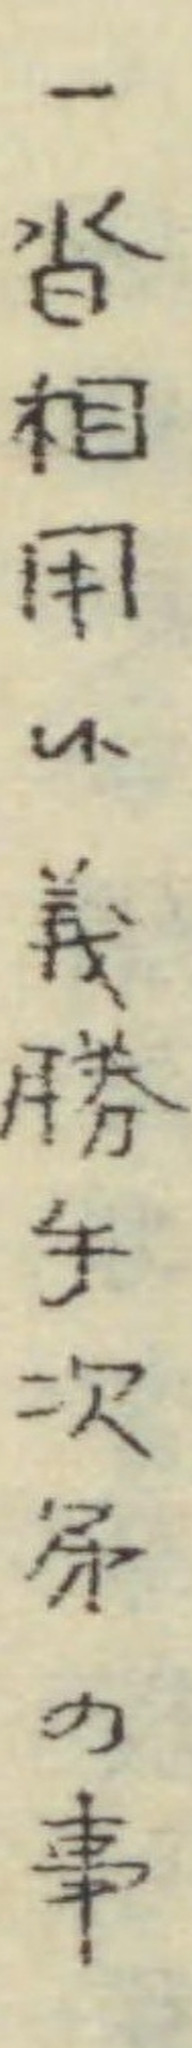一沓相用候義勝手次第の事
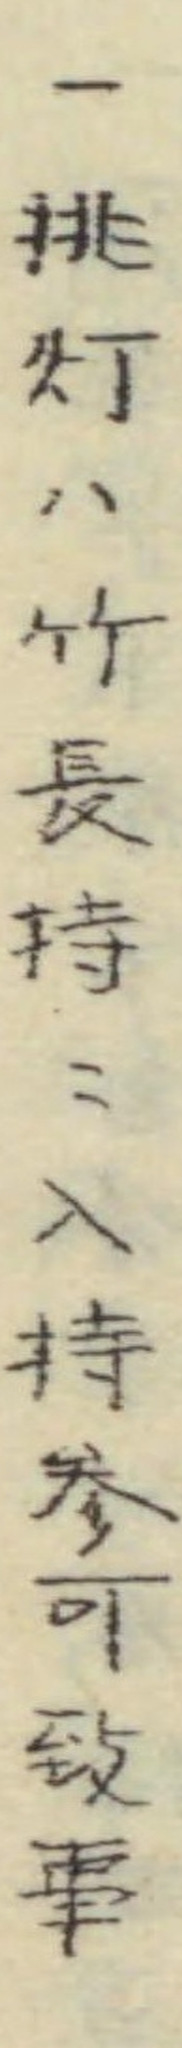一挑灯ハ竹長持二入持参可致事
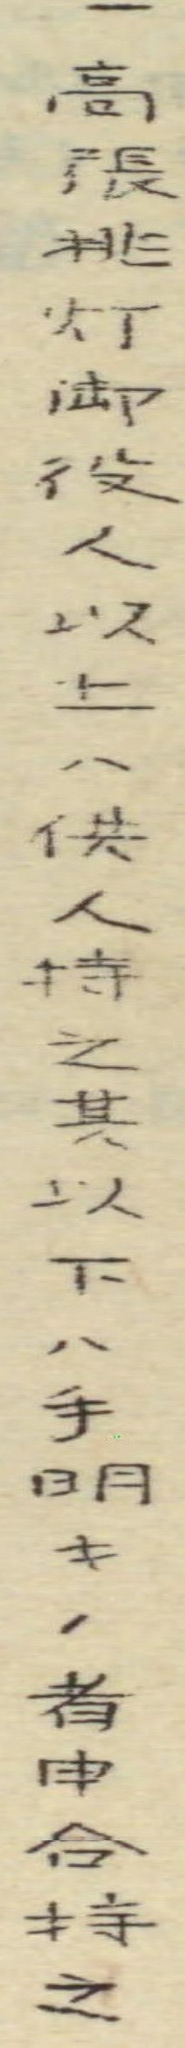一高張挑灯御役人以上ハ供人持之其以下ハ手明キノ者申合之
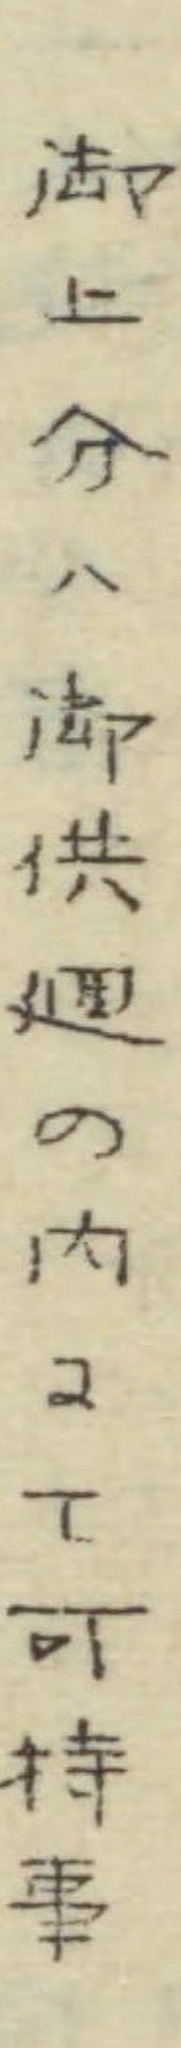御上分ハ御供廻の内にｔて可持事
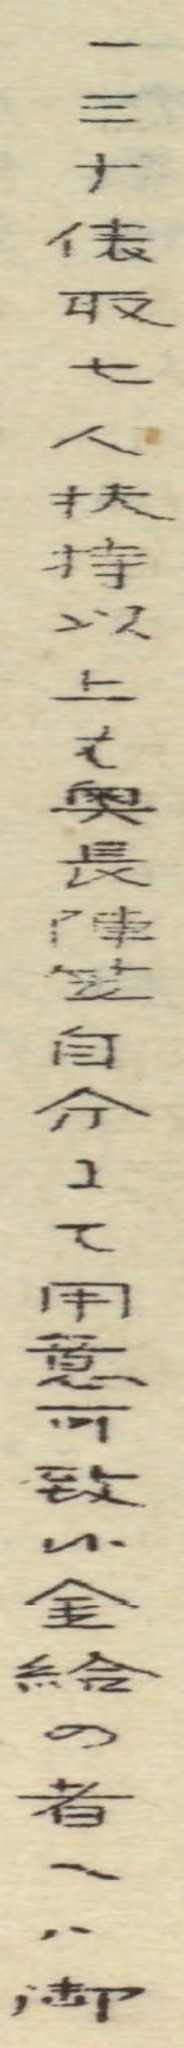一三十俵取七人扶持以上は奥長陣笠自分にて用意可致候金給の者へハ御
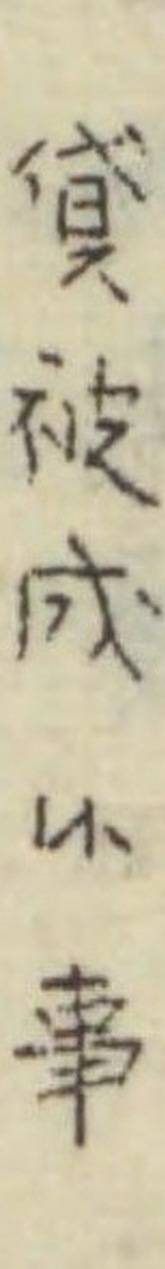貸被成候事
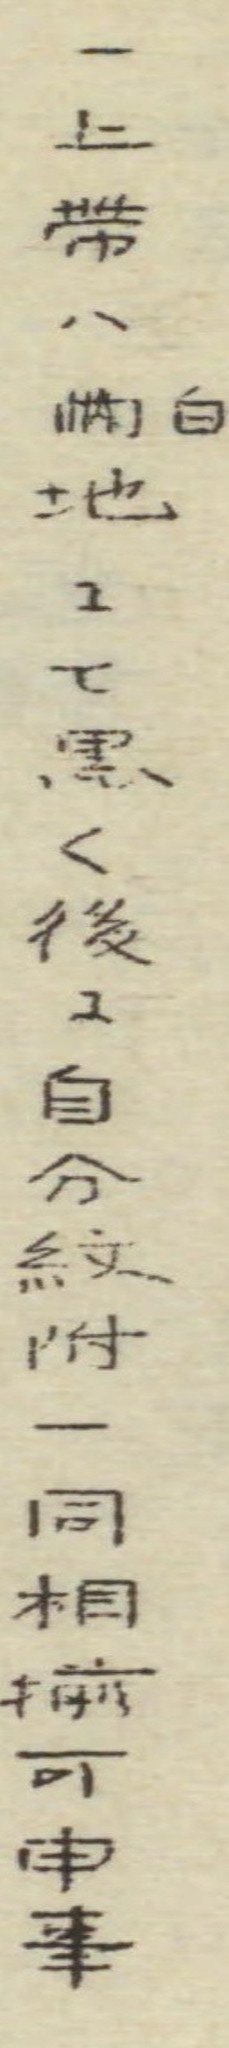一上帯ハ白地にて黒く後に自分紋附一同相揃可申事
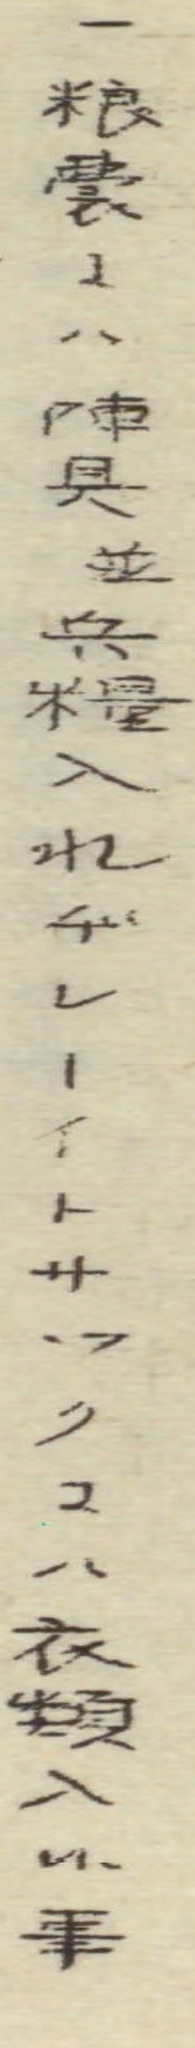一粮嚢にハ陣具並兵粮入れゲレーイトサツクにハ衣類入候事
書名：三河吉田藩動員史料
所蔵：国立国会図書館 National Diet Library, JAPAN
